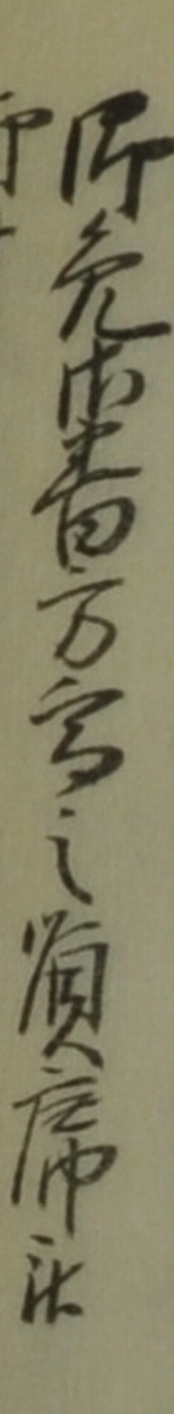御免御番方高之順席被
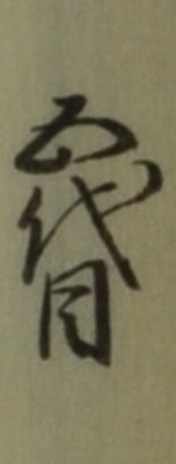五代目
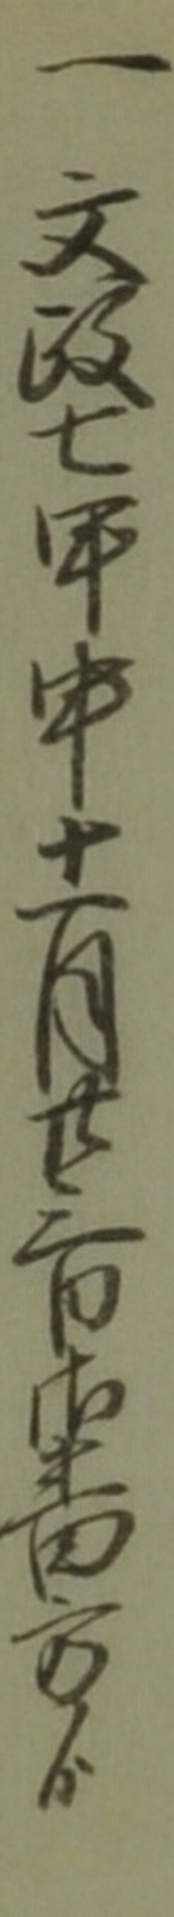一文政七甲申十一月廿三日御番方ゟ
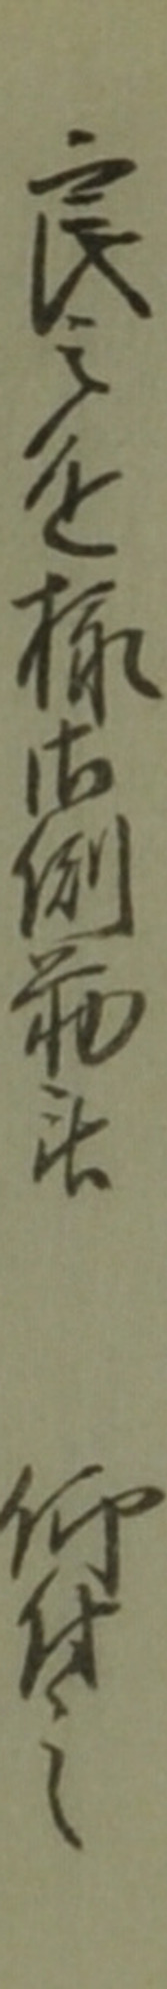良之進様御側勤被仰付之
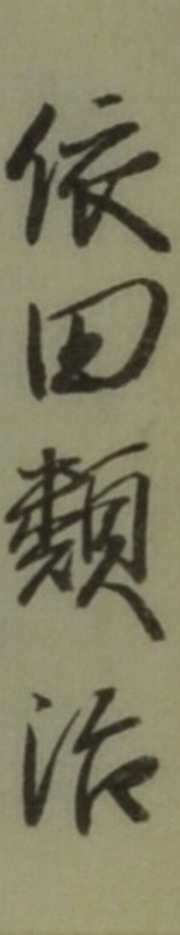依田類治
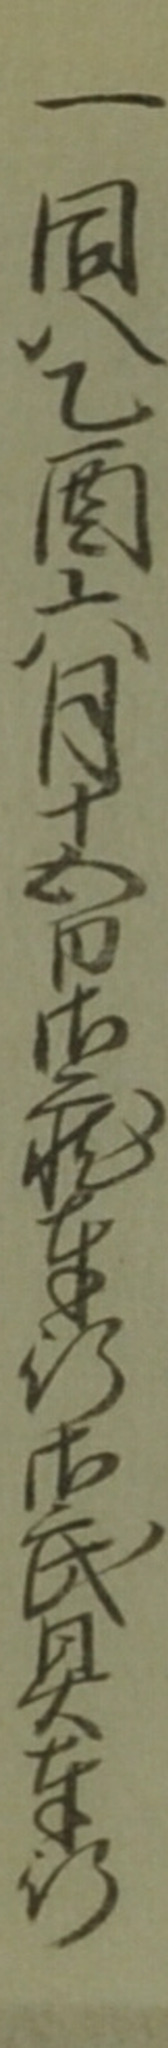同八乙酉六月十五日御蔵奉行御武具奉行
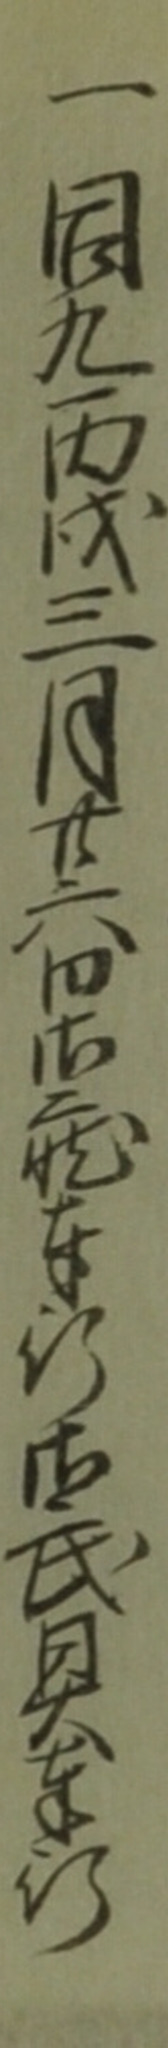一同九丙戌三月廿六日御蔵奉行御武具奉行
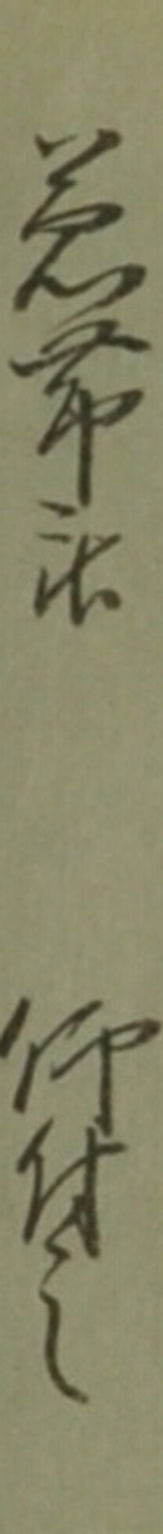兼帯被仰付之
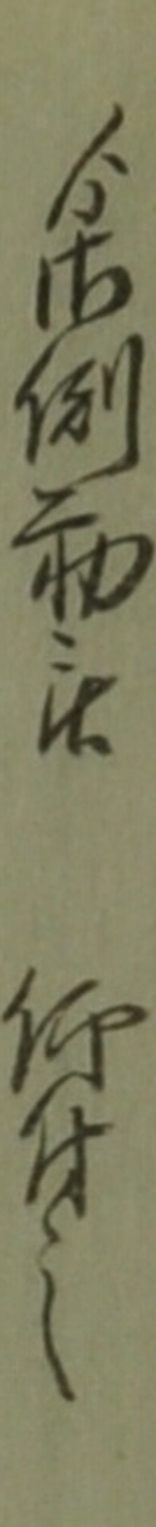ゟ御側勤被仰付之
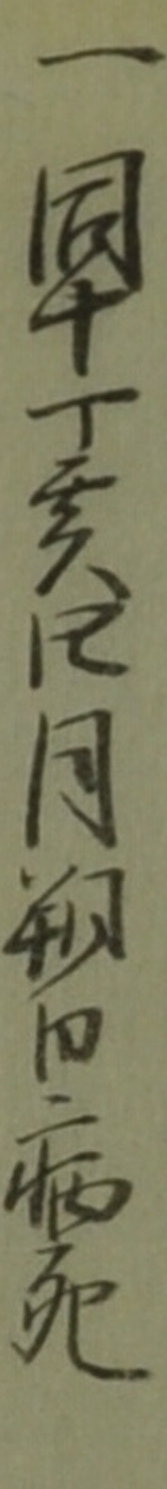一同十丁亥四月朔日病死
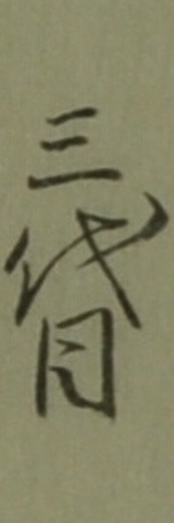三代目
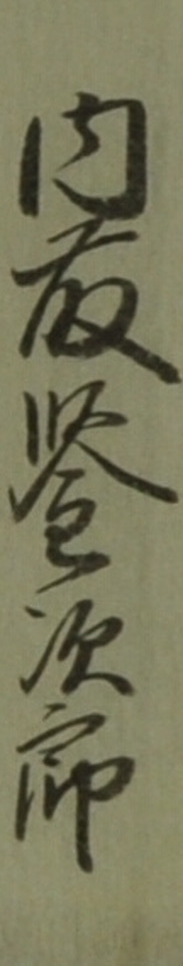内藤鍳次郎
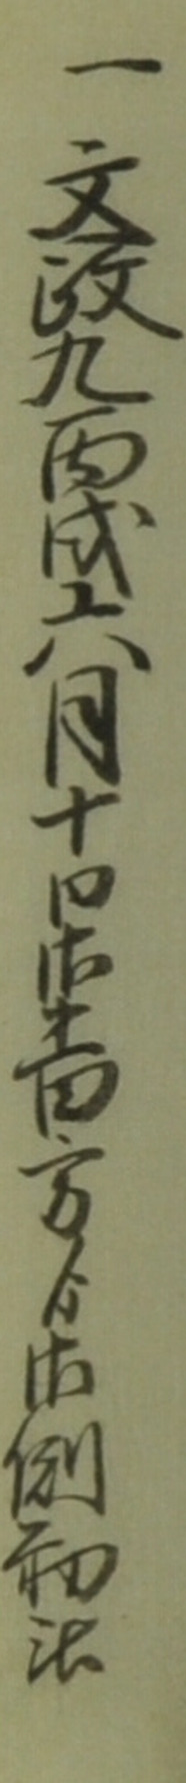一文政九丙戌六月十日御番方ゟ御側勤被

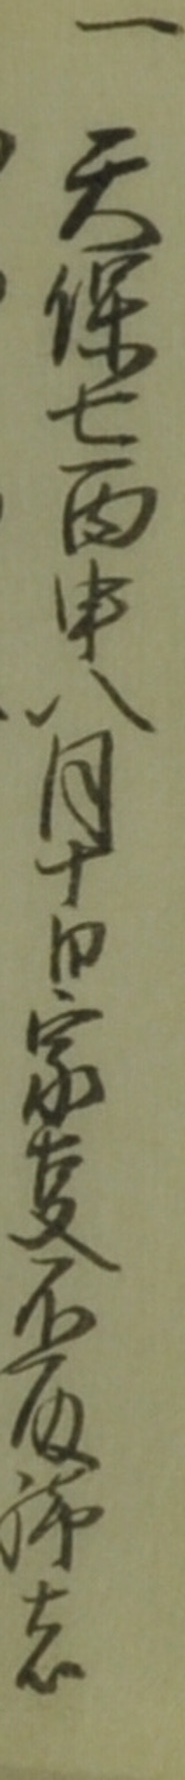一天保七丙申八月十日家事不取締者
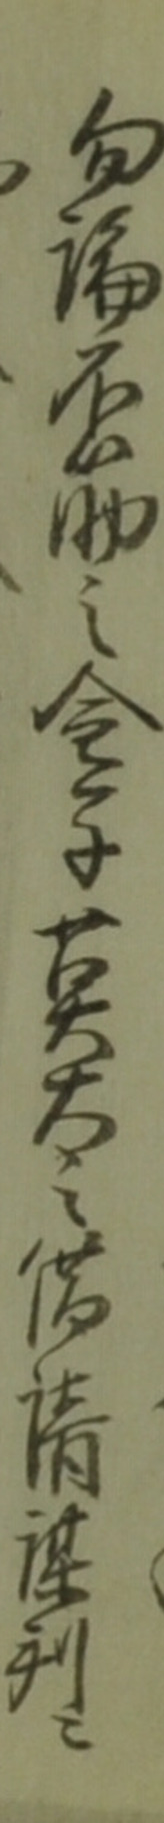勿論不筋之金子莫太之借請謀判ニ
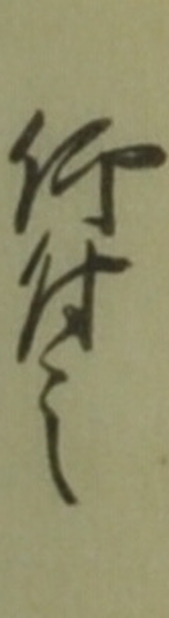仰付之
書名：諸御役代々録（五）
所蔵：伊那市立高遠町図書館・合同会社AMANE
